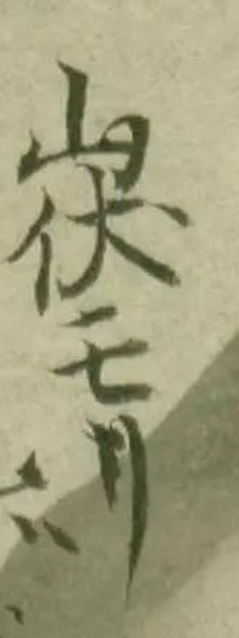山伏モリ
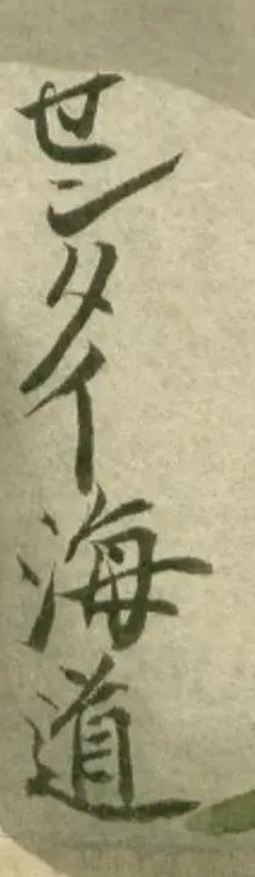センタイ海道
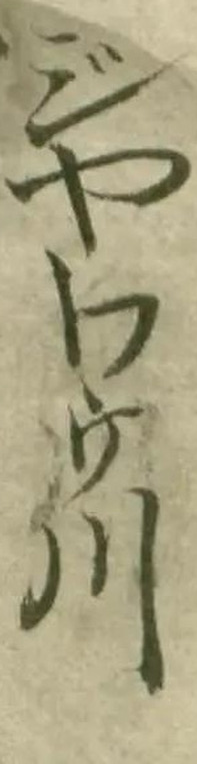ジヤワウ川
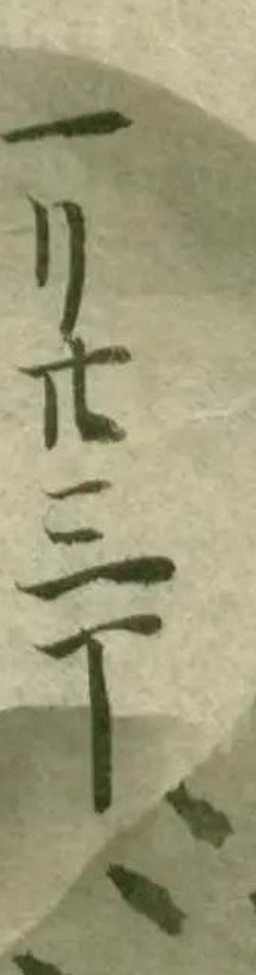一リ廿三丁
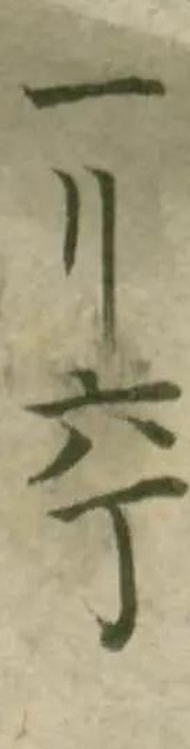一リ六丁
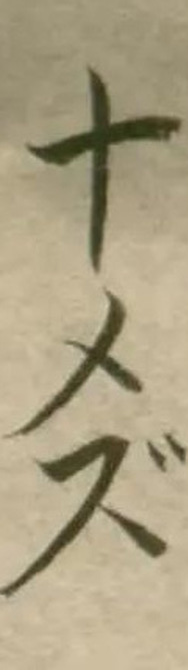ナメズ

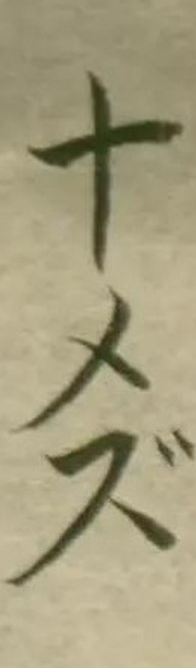ナメズ
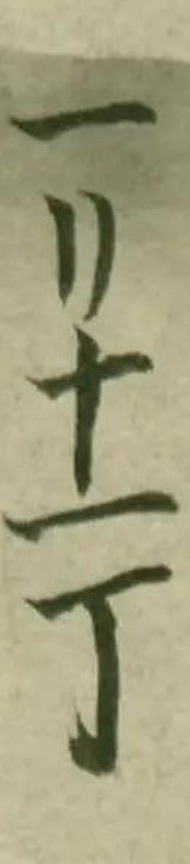一リ十一丁
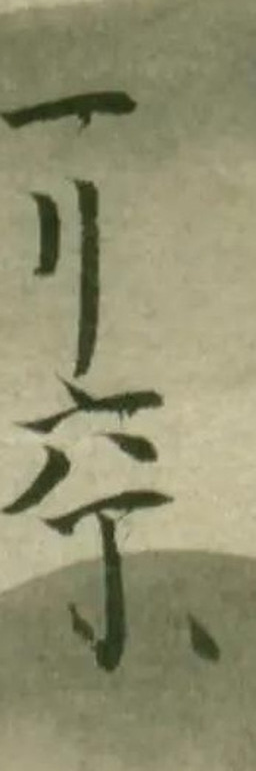一リ六丁
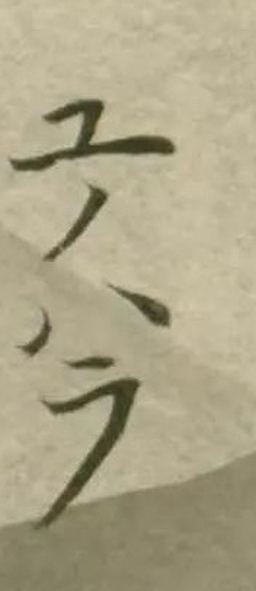ユノハラ
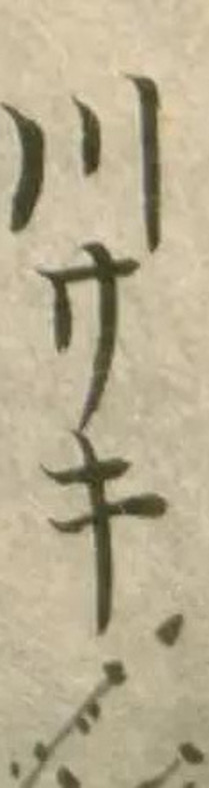川サキ

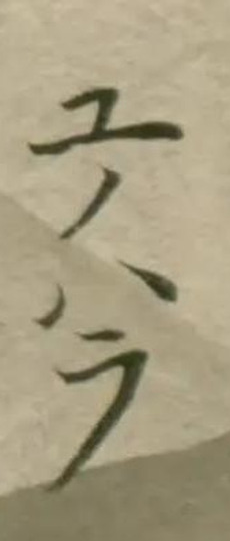ユノハラ
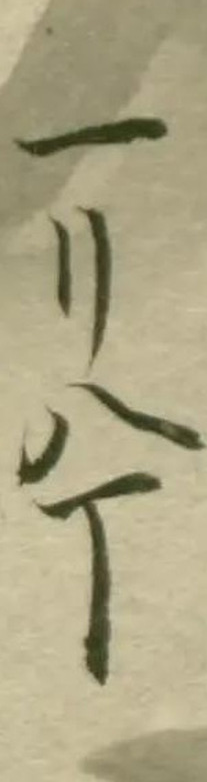一リ八丁
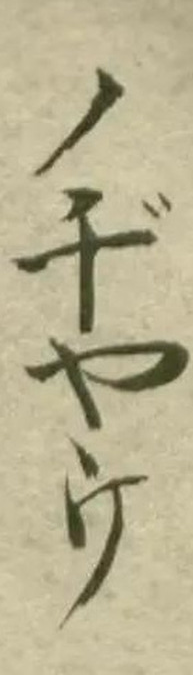ノヂヤウ
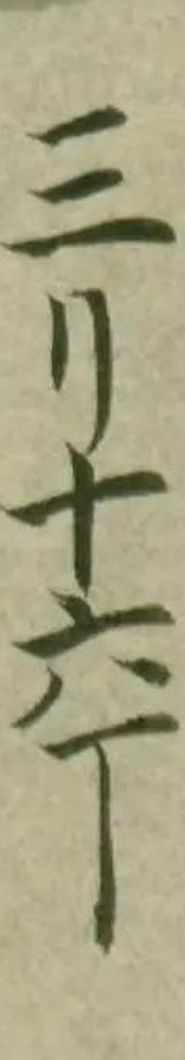三リ十六丁
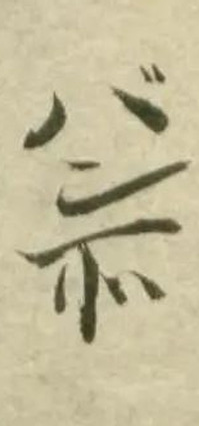バン所
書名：江戸より奥州津輕迄道筋之圖
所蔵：国立国会図書館 National Diet Library, JAPAN
